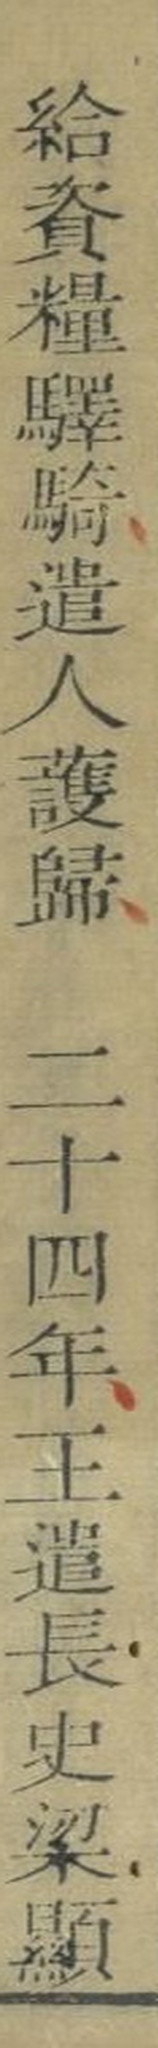給資糧駅騎遣人護帰二十四年王遣長史梁顕
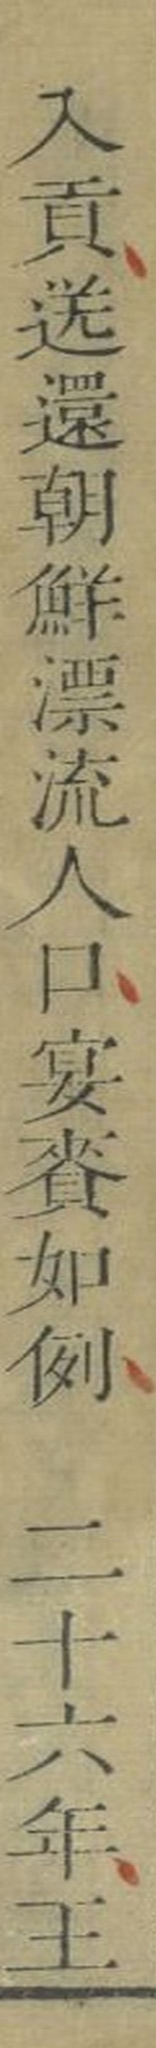入貢送還朝鮮漂流人口宴賚如例二十六年王
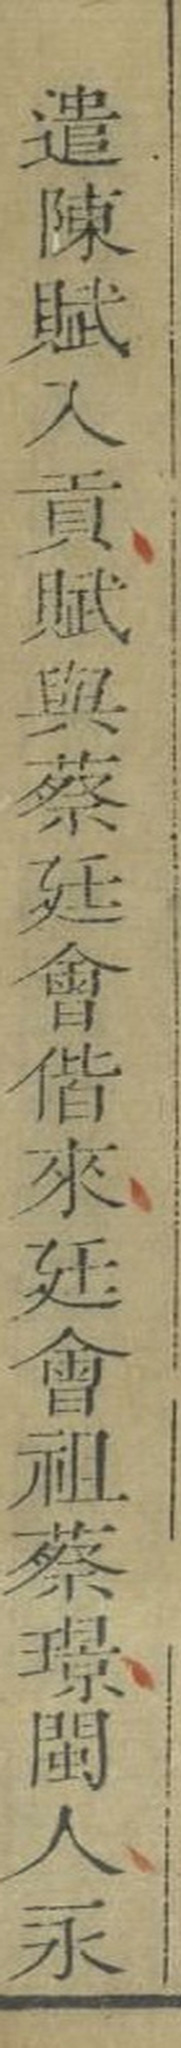遣陳賦入貢賦与蔡廷会偕来廷会祖蔡璟閩人永
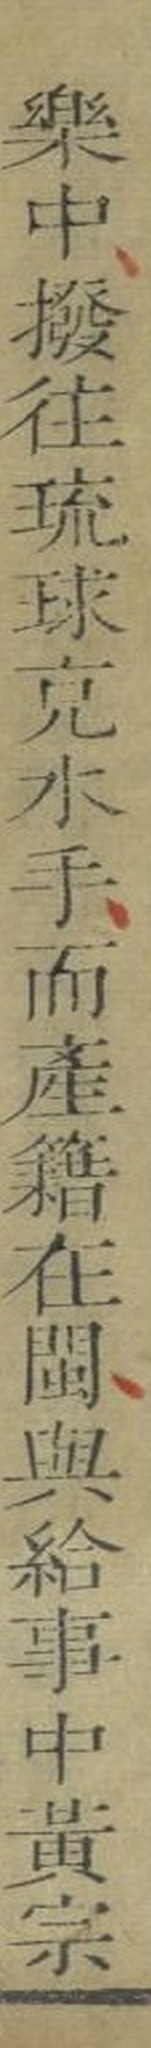楽中撥往琉球克水手而産籍在閩与給事中黄宗
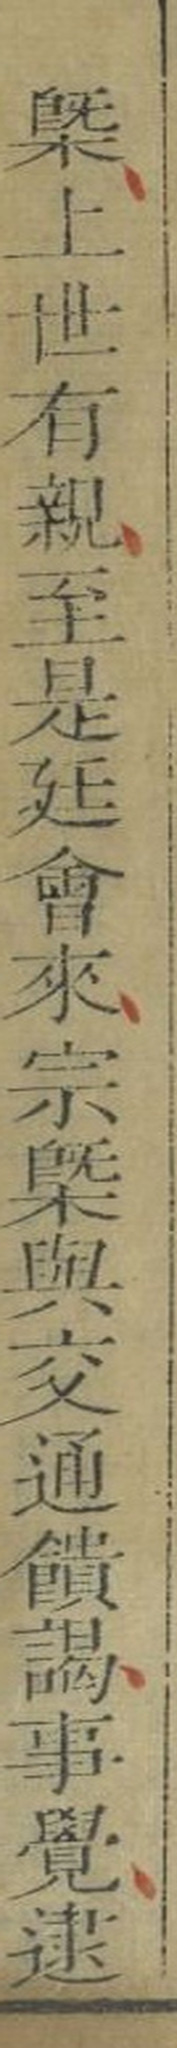概上世有親至是廷会来宗概与交通饋謁事覚逮

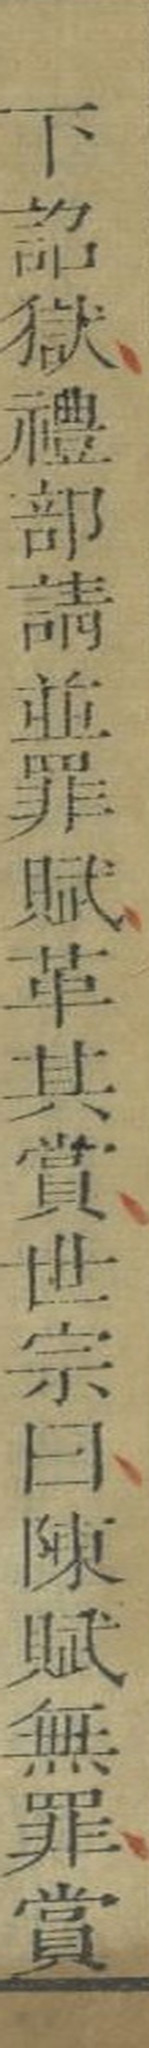下詔獄礼部請並罪賦革其賞世宗曰陳賦無罪賞
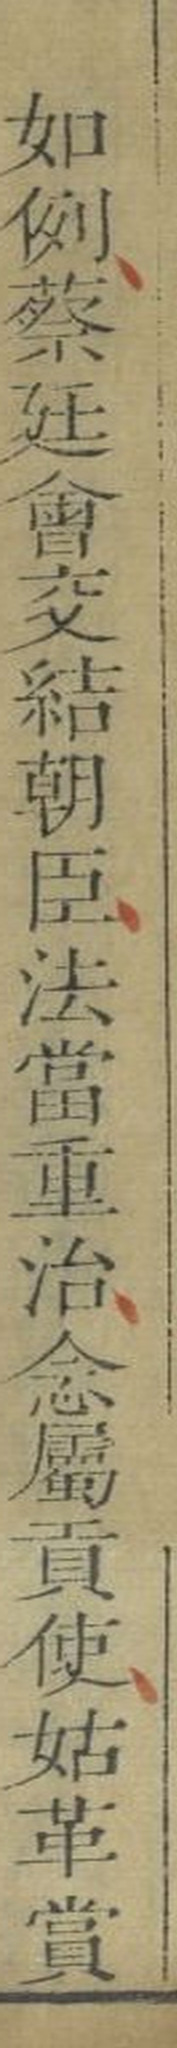如例蔡廷会交結朝臣法当重治念属貢使姑革賞
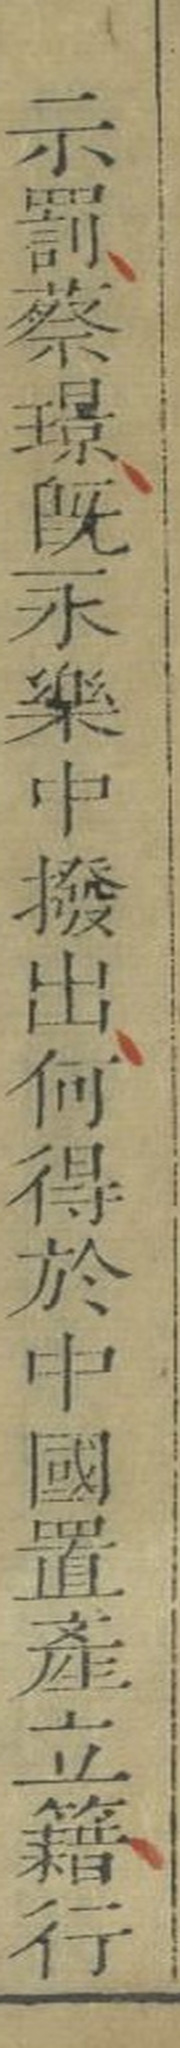示罰蔡璟既永楽中撥出何得於中国置産立籍行
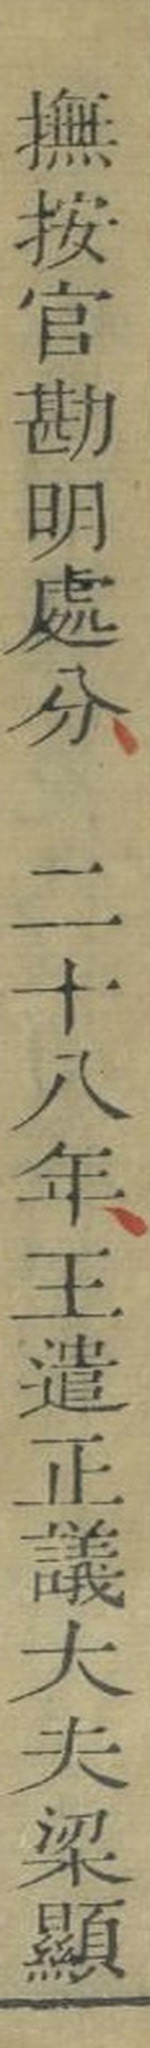撫按官勘明処分二十八年王遣正議大夫梁顕
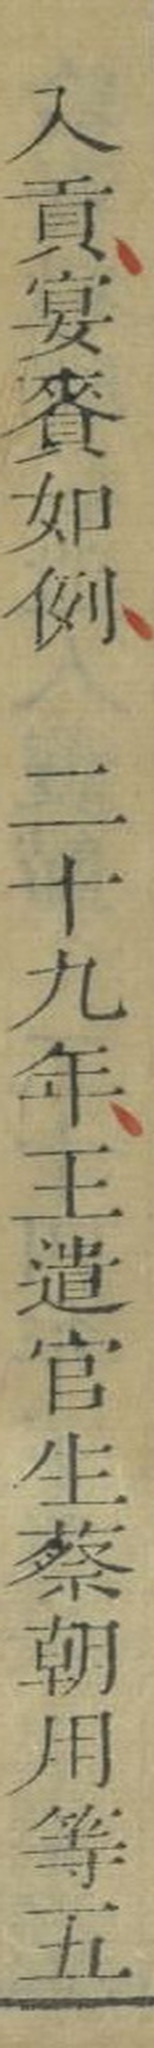入貢宴賚如例二十九年王遣官生蔡朝用等五
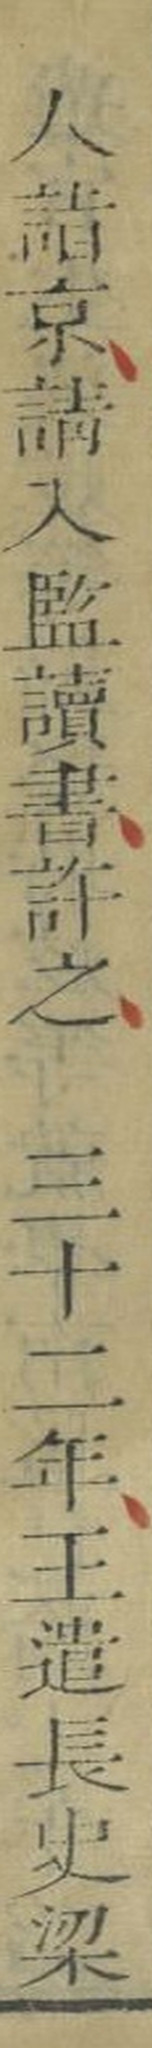人詣京請入監読書許之三十二年王遣長史梁
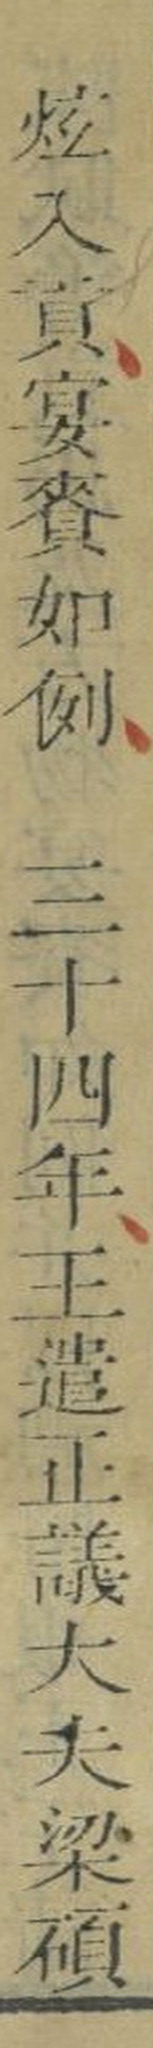炫入貢宴賚如例三十四年王遣正議大夫梁碩
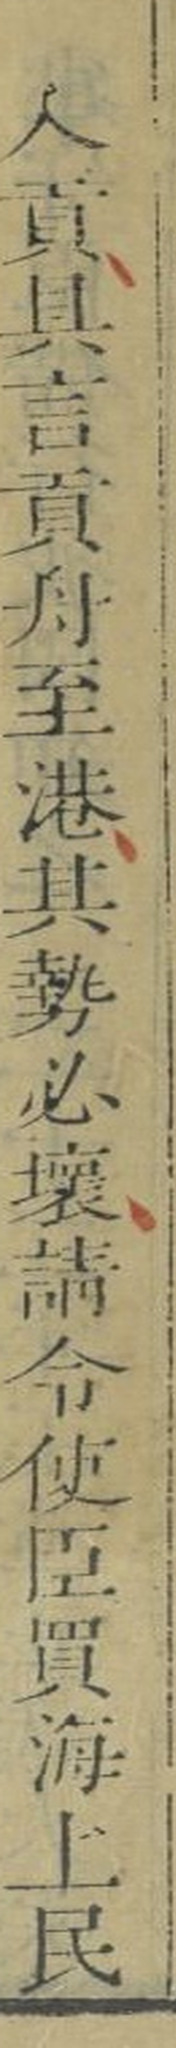入貢具言貢舟至港其勢必壊請令使臣買海上民
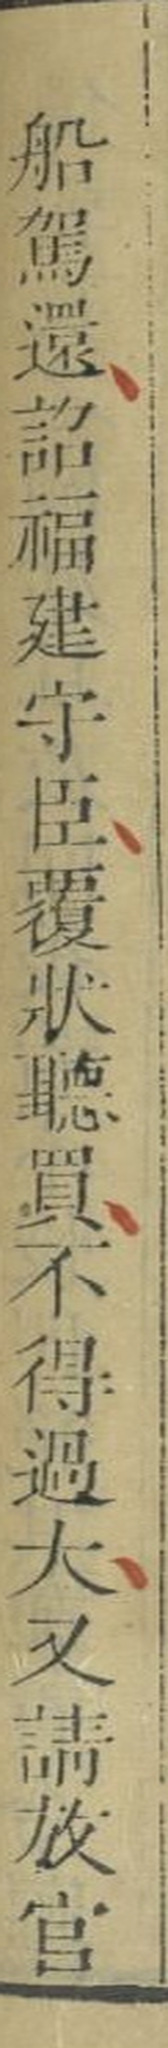船駕還詔福建守臣覆状聴買不得過大又請放官
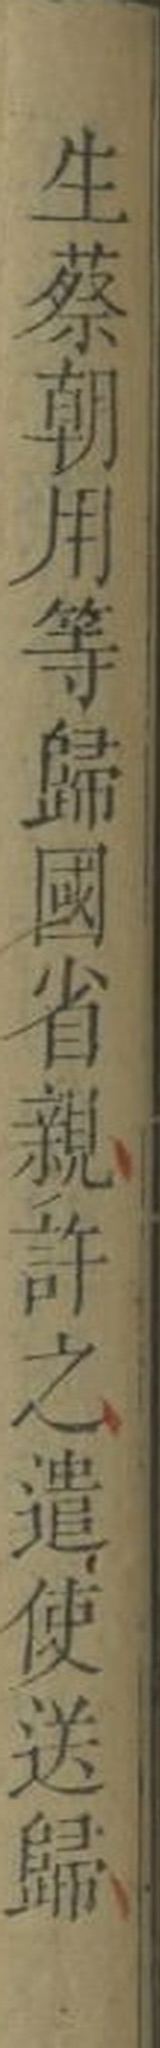生蔡朝用等帰国省親許之遣使送帰
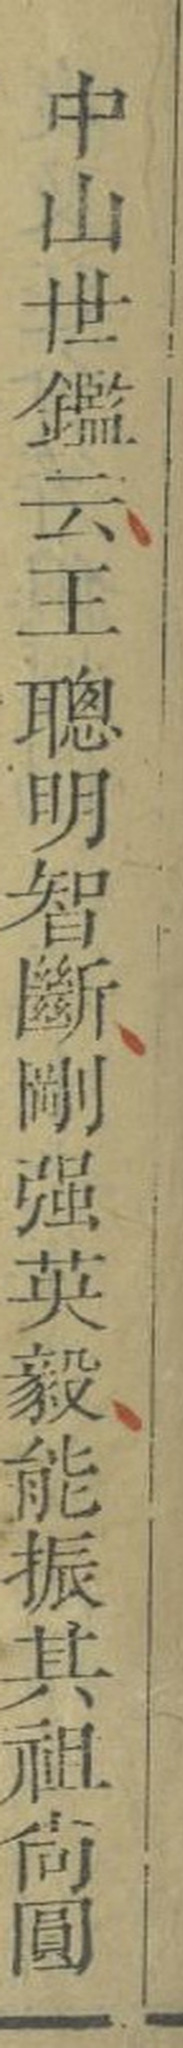中山世鑑云王聡明智断剛強英毅能振其祖尚円
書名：中山伝信録 巻三
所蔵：University of the Ryukyus Library
